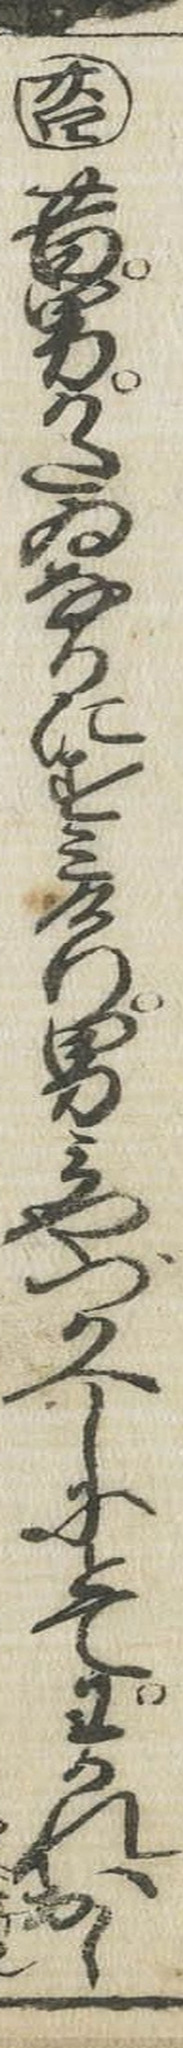(廿四)昔。男。かたゐなかにすみけり。男みやづかへしにとて。わかれおし
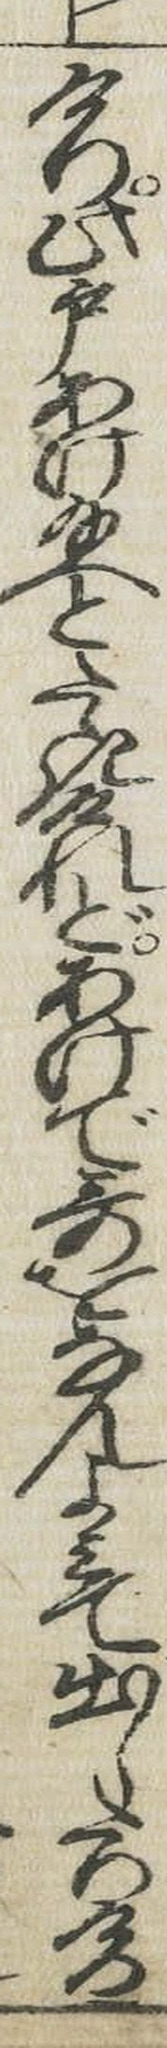けり。此戸あけ給へとたゝきけれど。あけで哥をなんよみて。出したりける
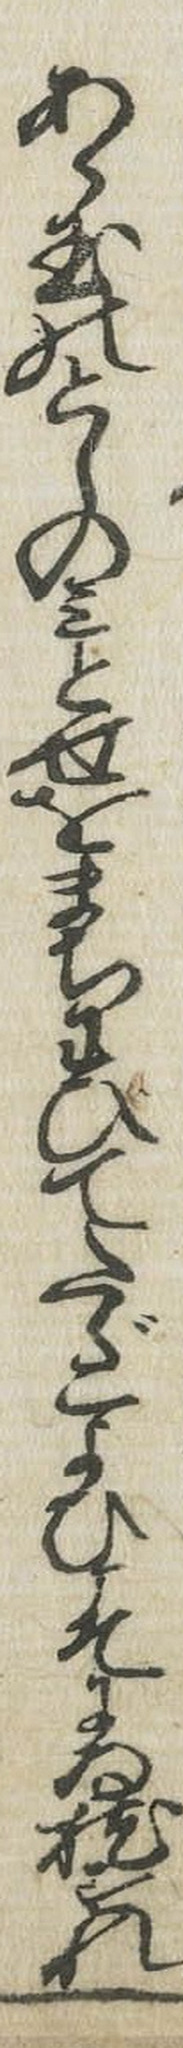あら玉のとしのみとせをまちわびてたゞこよひこそにゐ枕すれ
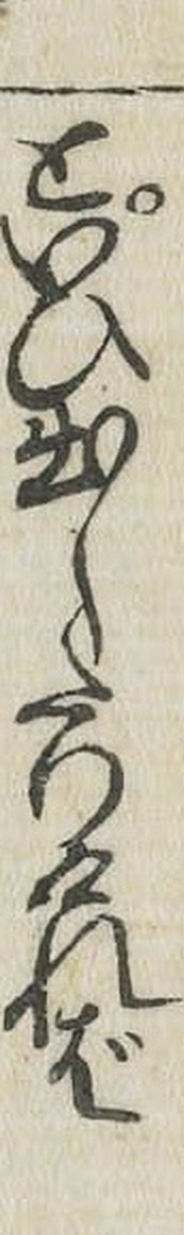と。いひ出したりければ
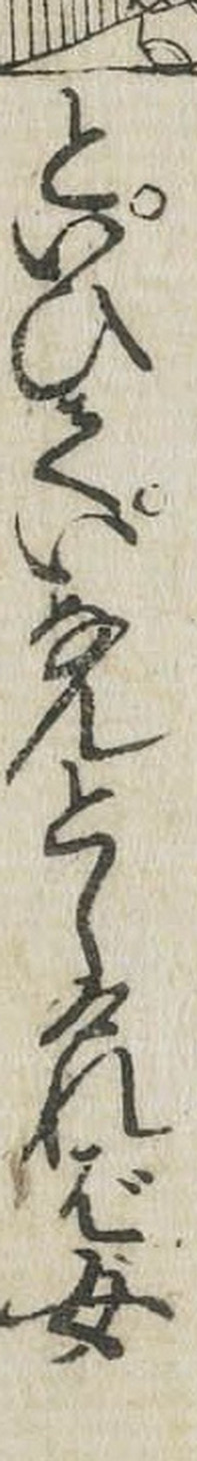と。いひて。いなんとしければ女
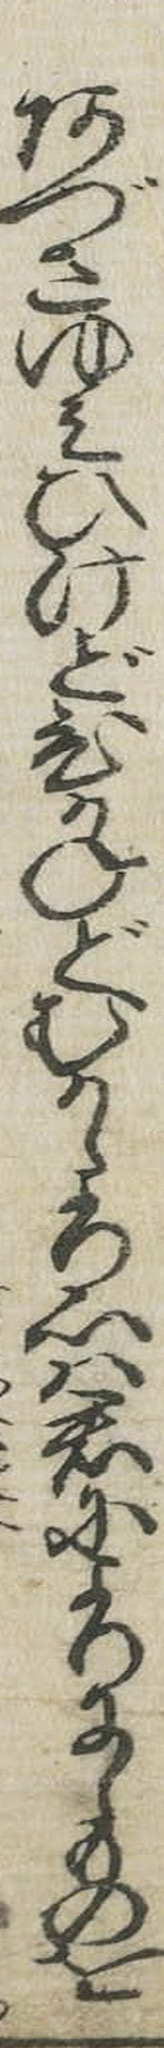あづさゆみひけどひかねどむかしより心は君によりにしものを

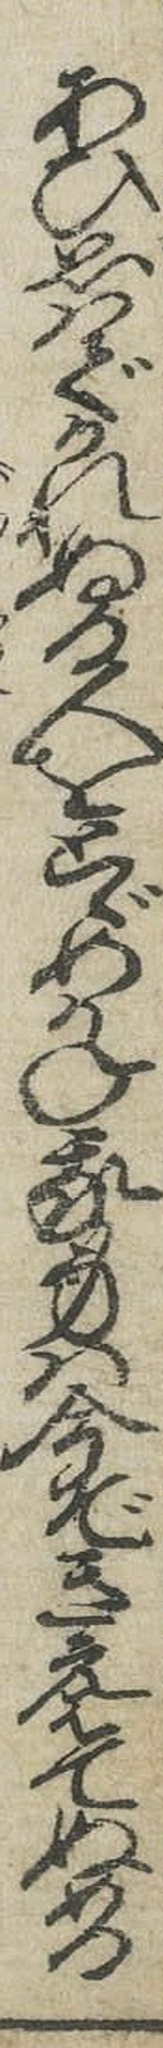あひ思はでかれぬる人をとゞめかね我身は今ぞきえはてぬめる
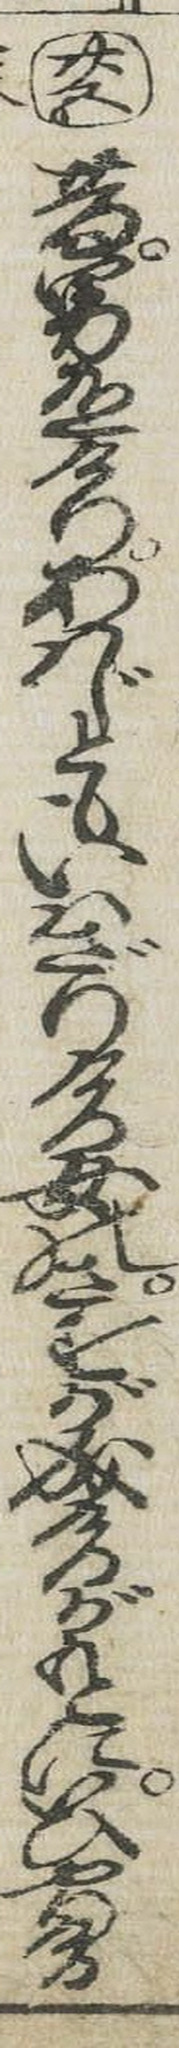(廿五)昔。男有けり。あはじともいはざりける女の。さすが成けるがもとに。いひやりける
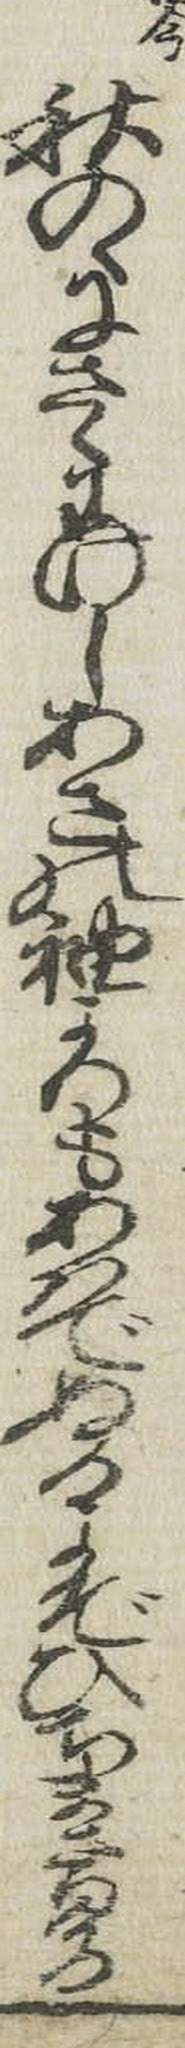古今秋のゝにさゝわけしあさの袖よりもあはでぬるよぞひちまさりける
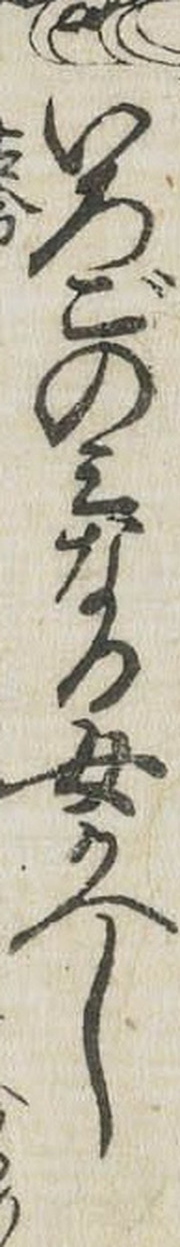いろごのみなる女かへし
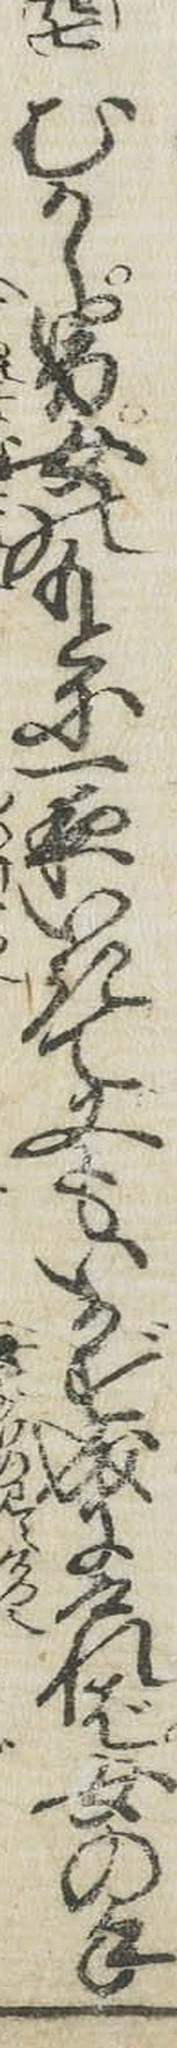(廿七)むかし。男。女のもとに一夜いきて又もいかず成にければ。女の手
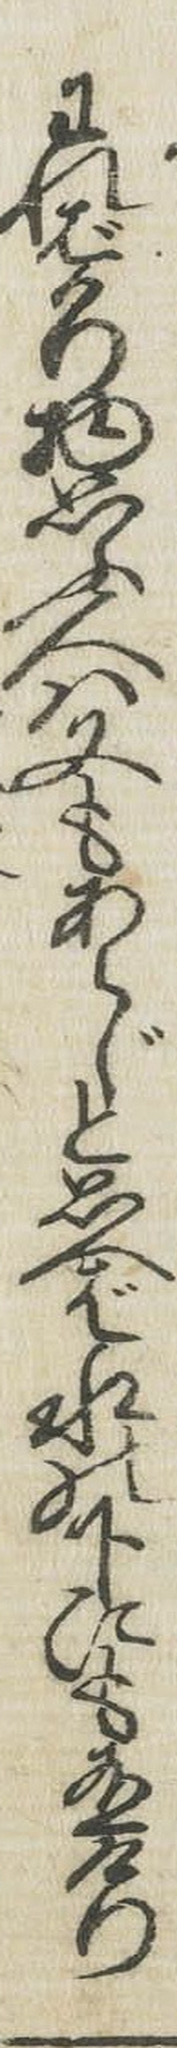わればかり物思ふ人は又もあらじと思へば水の下にも有けり
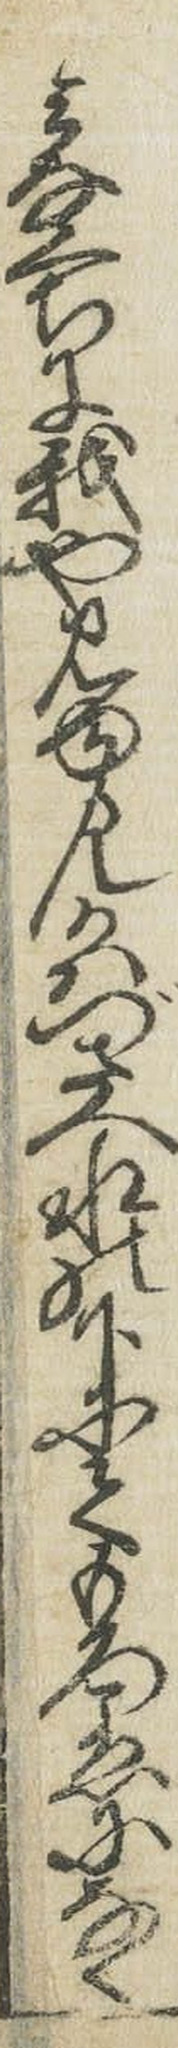みなくちに我や見ゆらんかはづさへ水の下にてもろこゑになく
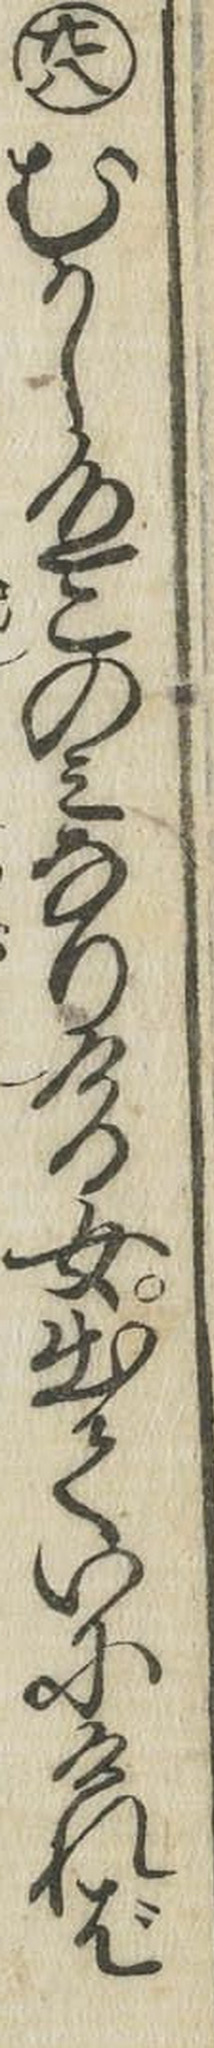(廿八)むかし色このみなりける女。出ていにければ
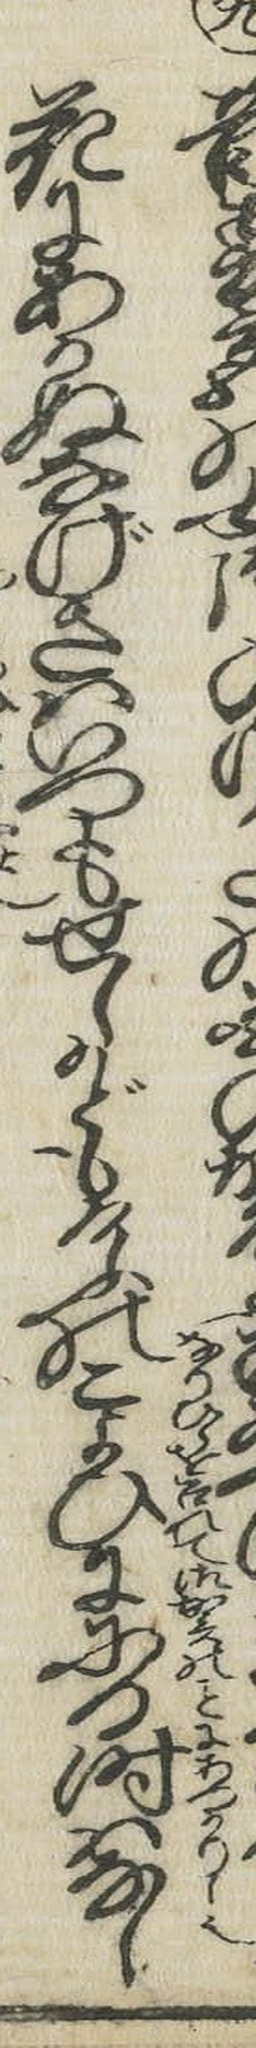花にあかぬなげきはいつもせしかどもけふのこよひににる時はなし
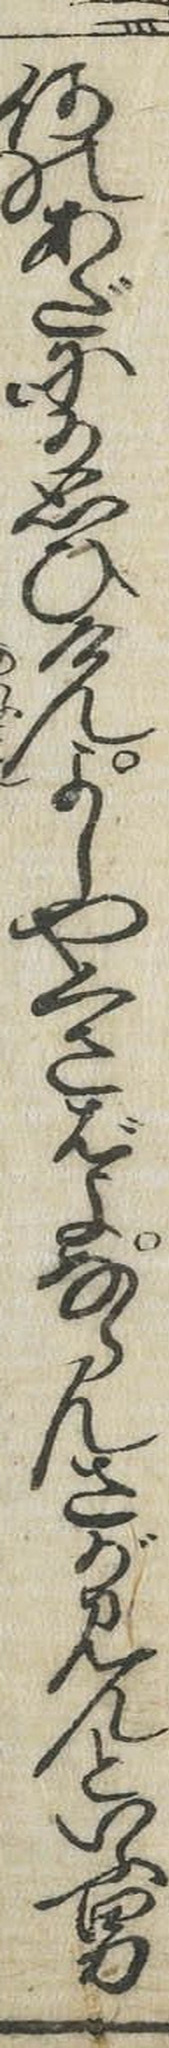何のあだにか思ひけん。よしやくさばよ。ならんさが見んといふ。男
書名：新板絵入伊勢物語 : かうしやく付 2巻 上
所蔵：東京学芸大学教育コンテンツアーカイブ
